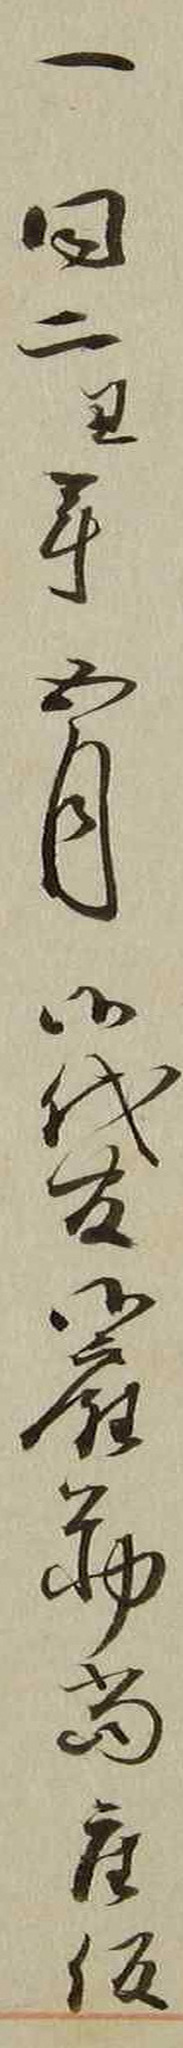一同二丑年五月御代官御雇勤当座仮
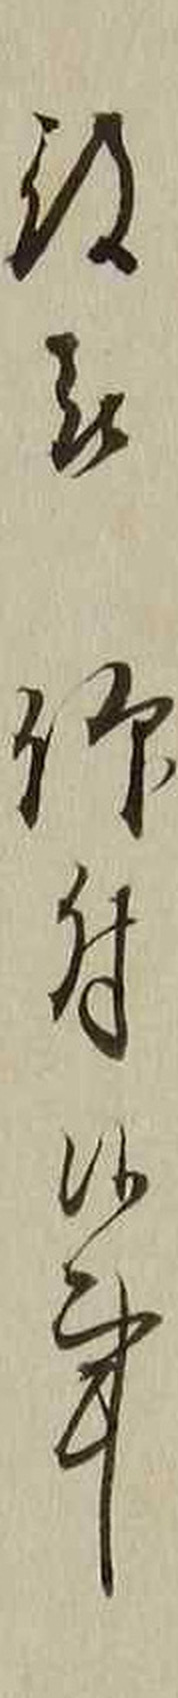役被仰付候事
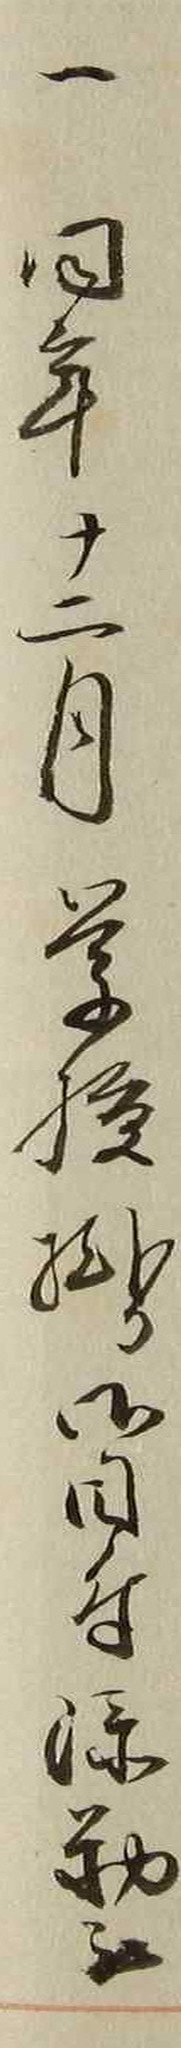一同年十二月学校掛り御目付添勤被
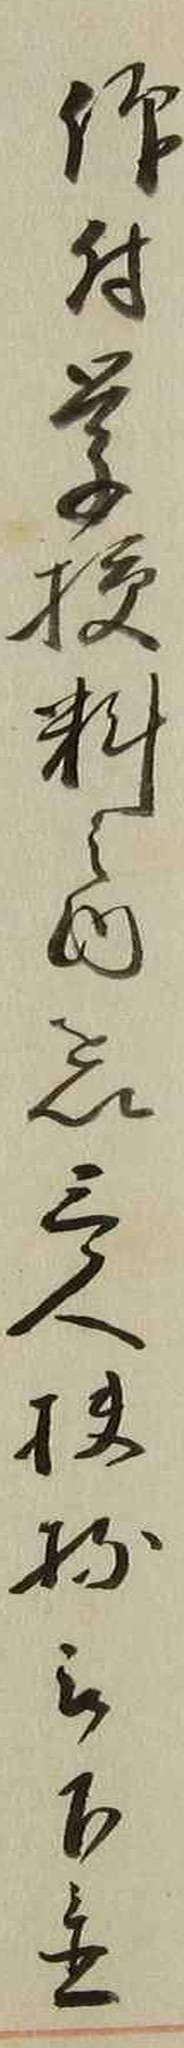仰付学校料之内を以三人扶持被下置
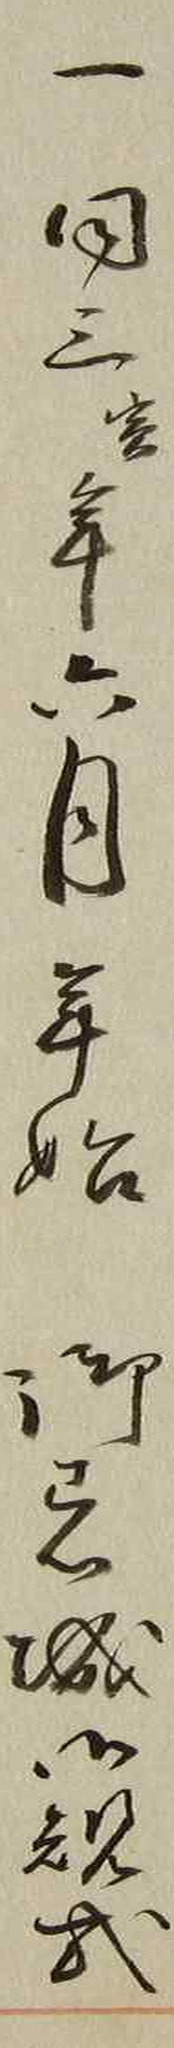一同三寅年六月年始御着城御規式
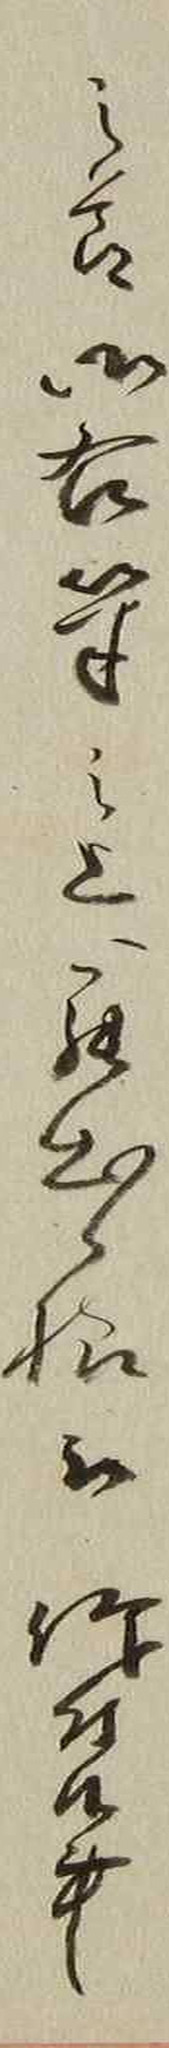之節御右筆之上へ罷出候様被仰付候事
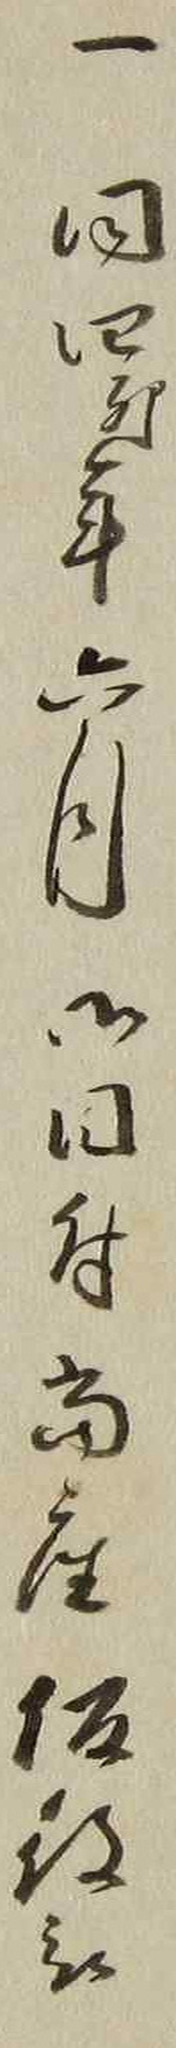一同四卯年六月御目付当座仮役被
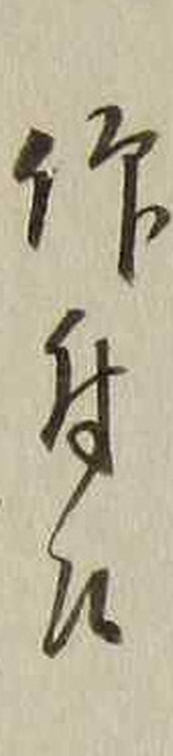仰付候
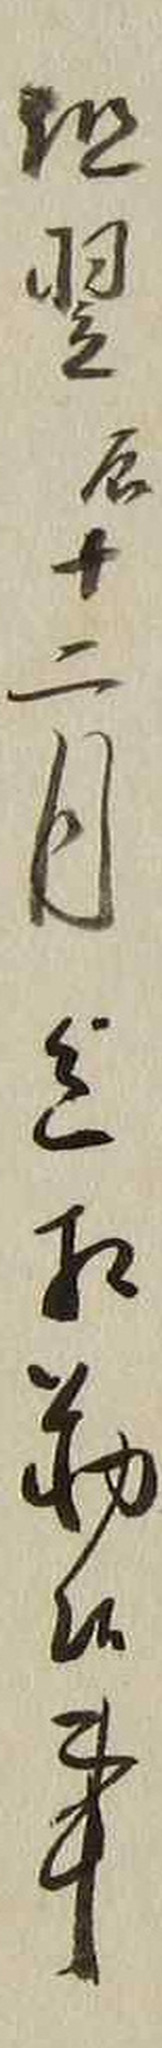但翌辰十二月迄相勤候事
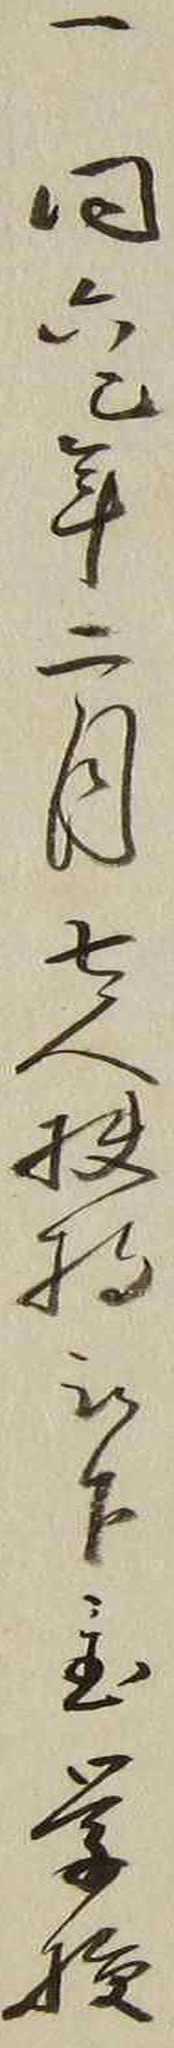一同六巳年二月七人扶持被下置学校
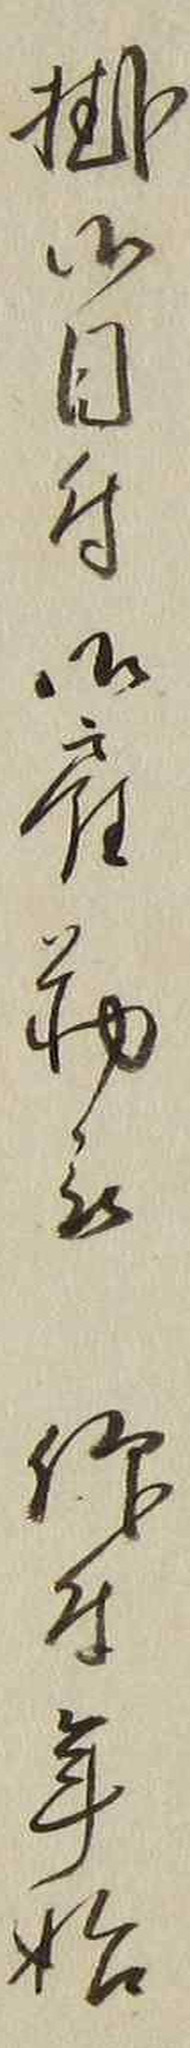掛御目付御雇勤被仰付年始
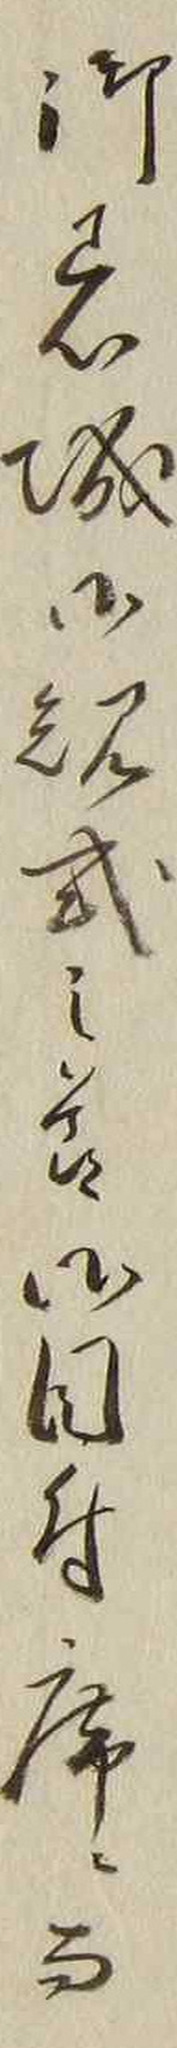御着城御規式之節御目付席ニ而

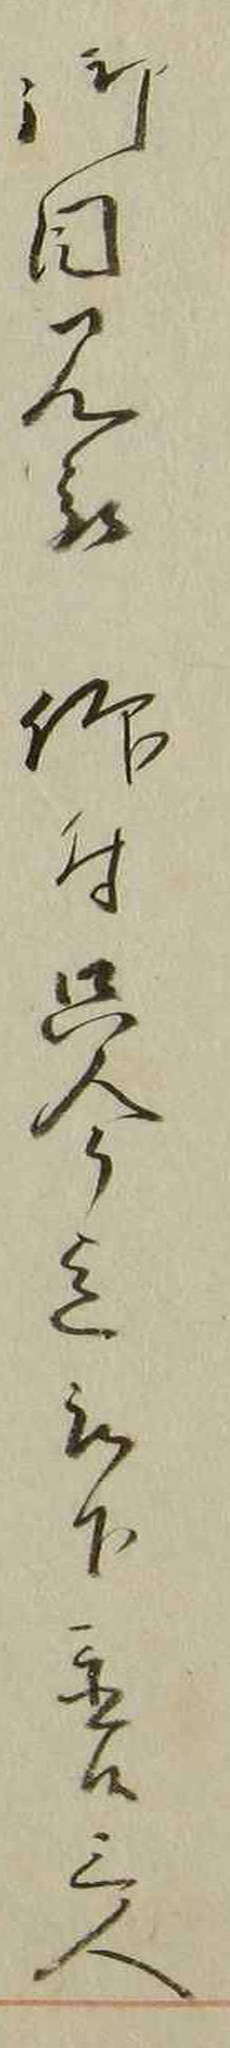御目見被仰付只今迄被下置候三人
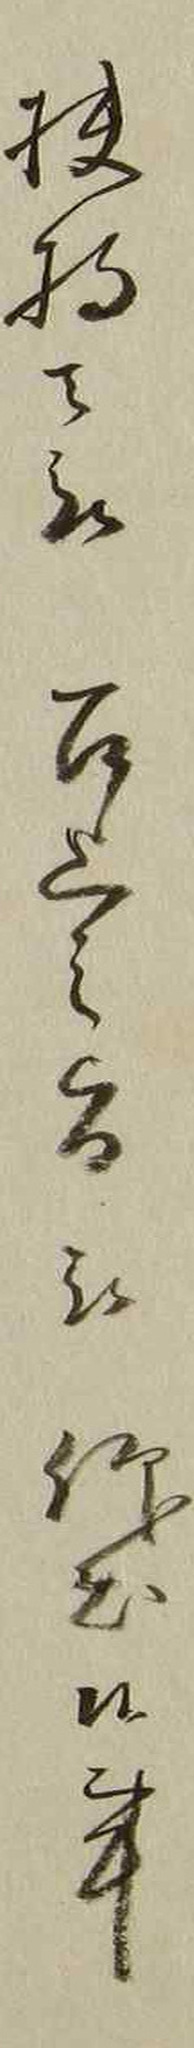扶持者被召上之旨ｈ被仰出候事
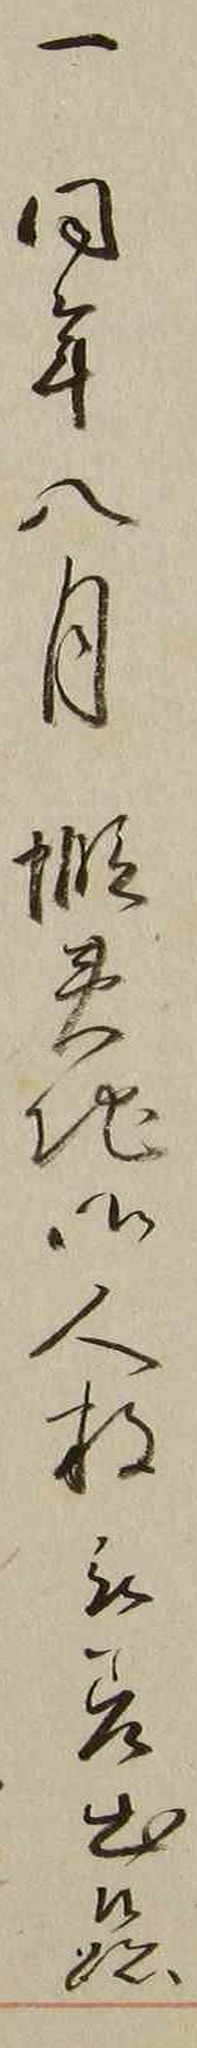一同年八月蝦夷地御人数被差出候所
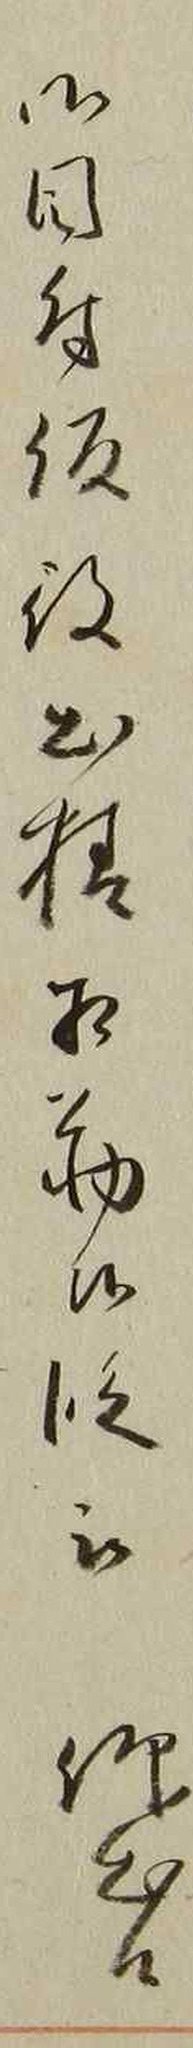御目付仮役出精相勤候段被仰出候
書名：諸士系譜　巻之204　や之部1
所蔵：会津若松市立会津図書館
